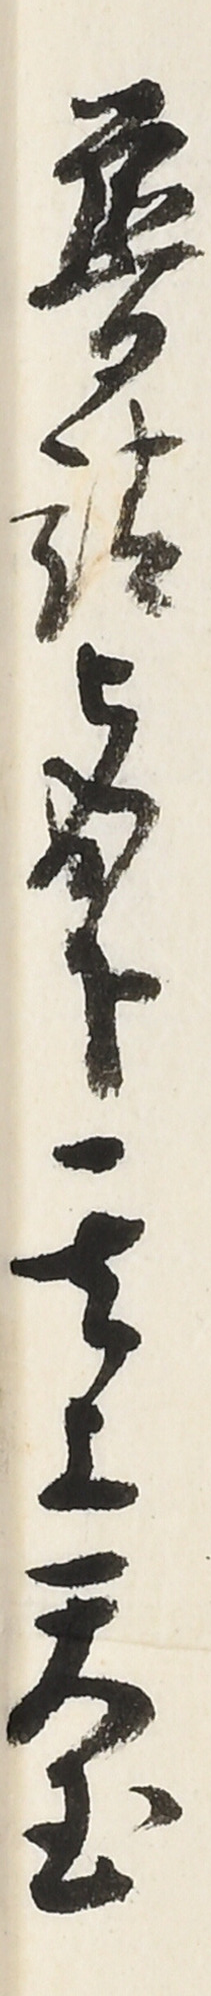普請被成下其上天王

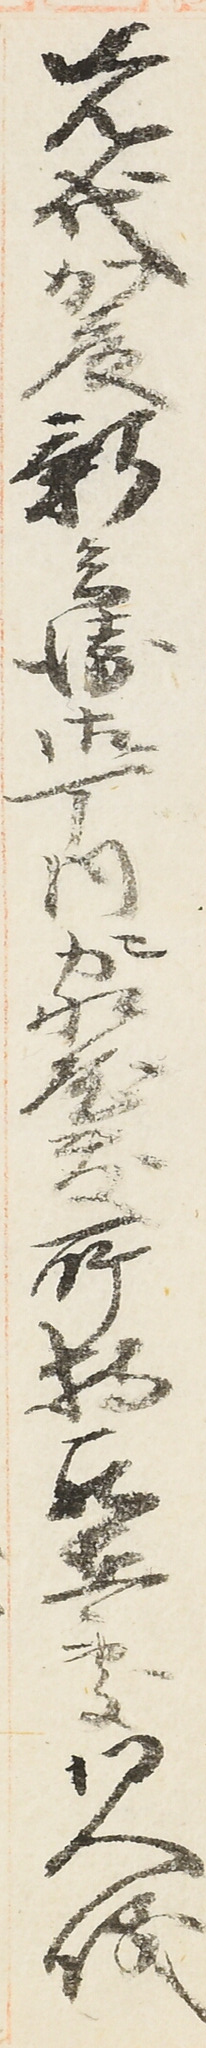先代加藤新兵衛御丁内ニ家屋敷所持罷在候処同人儀
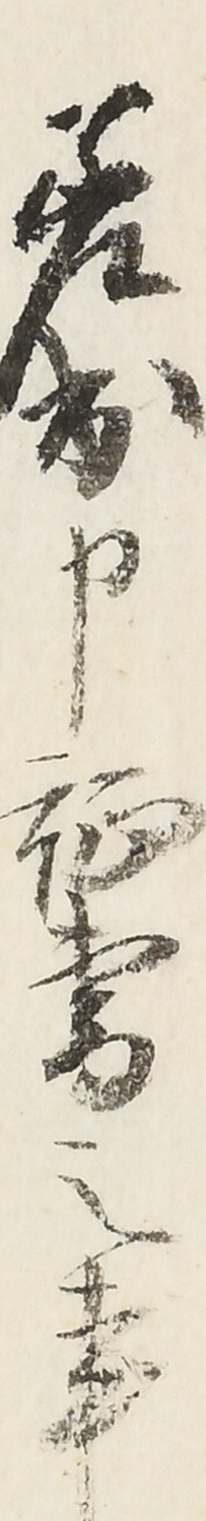差出申証書之事
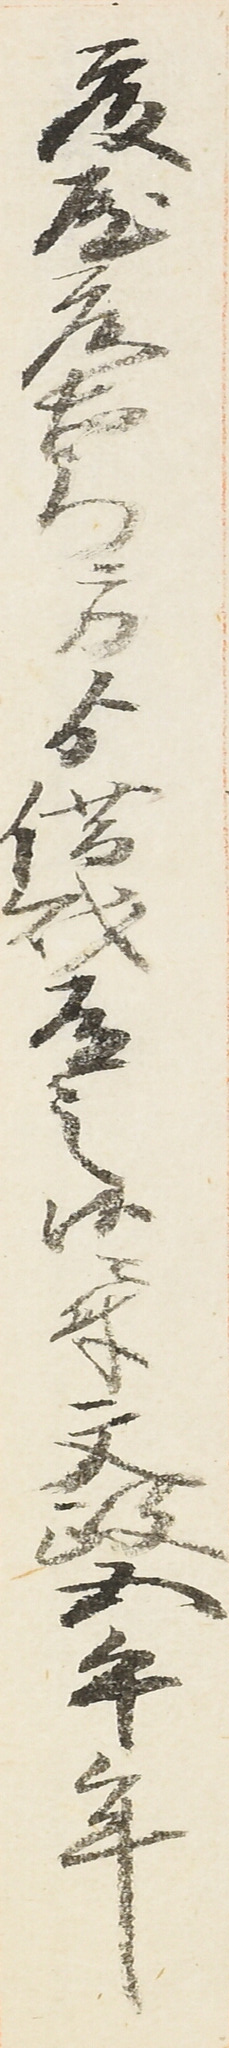藤屋藤右衛門方ゟ借財有之候ニ付文政五午年
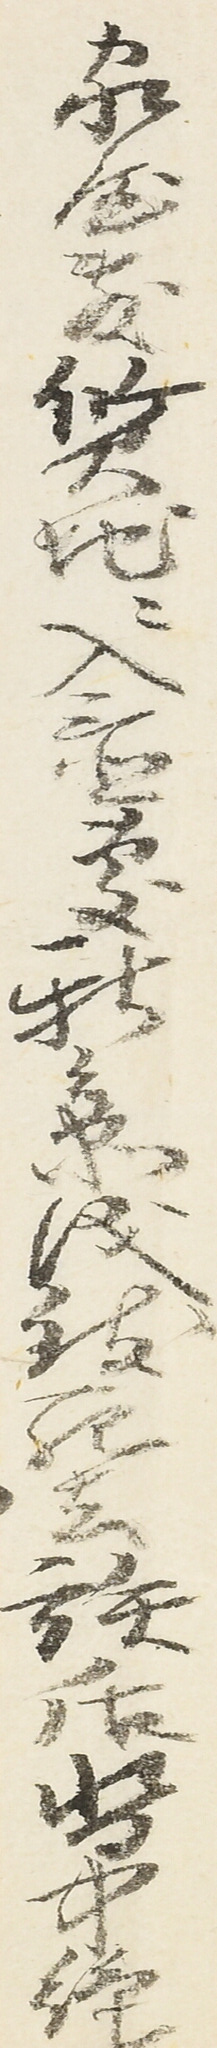家屋敷質地ニ入置処新兵衛儀致死去候后暫中絶ニ
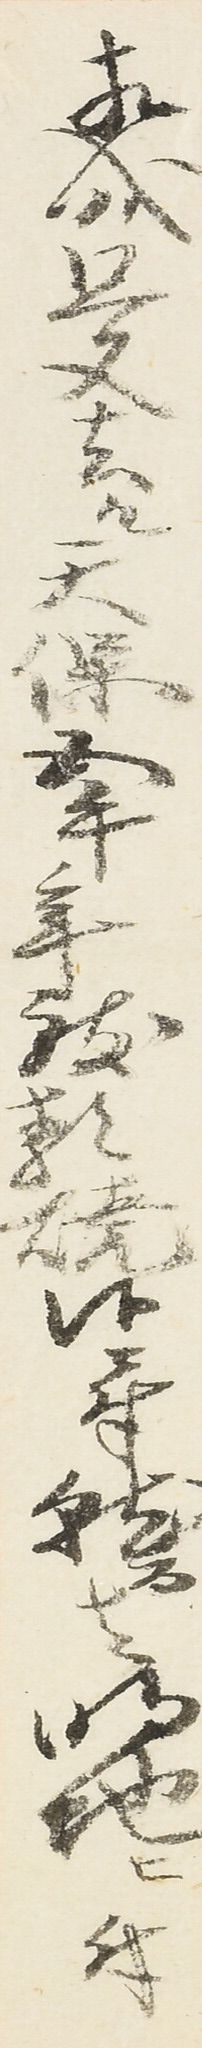相成且又去ル天保五午年致類焼候ニ付就而者明地ニ付
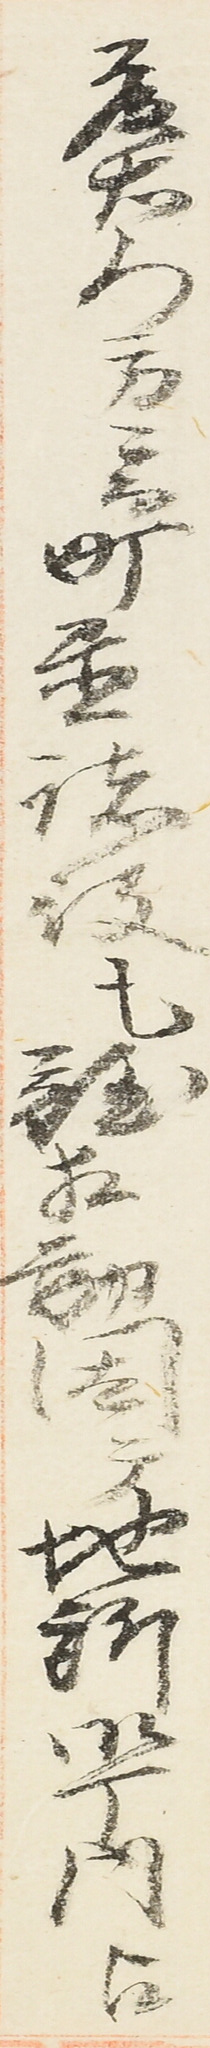藤右衛門方ニ而町置諸役も難相勤因テ地所御丁内江
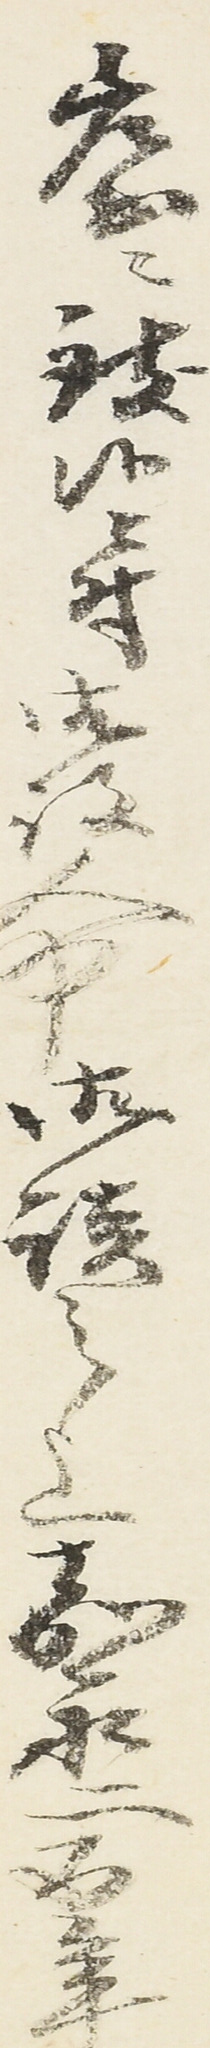差出ニ致候ニ付御役人中御談之上嘉永二酉年
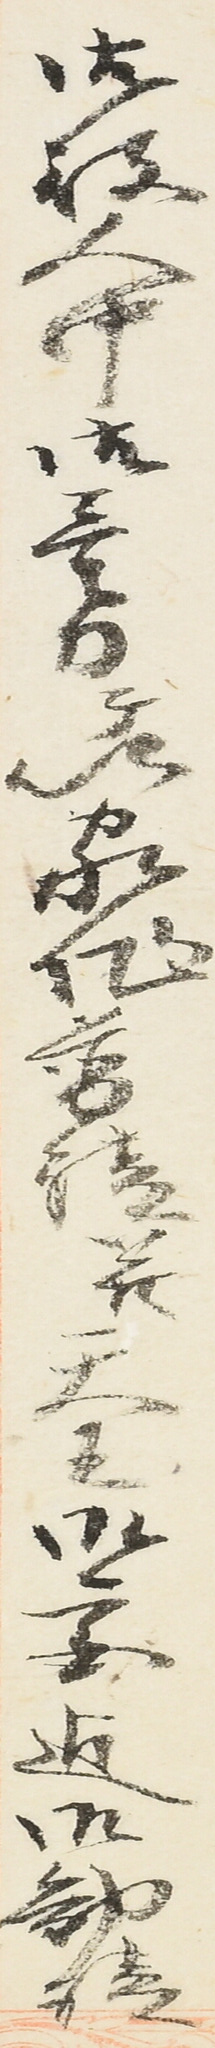御役人中御尽力ヲ以家作普請并天王御宮迄御勧請
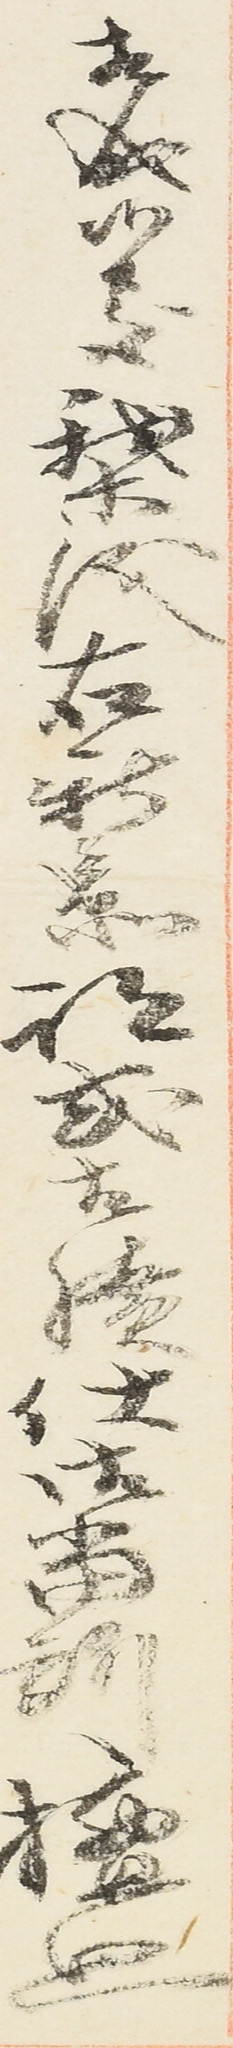相成候処我等儀右新兵衛跡式相続仕御番所へ檀廻
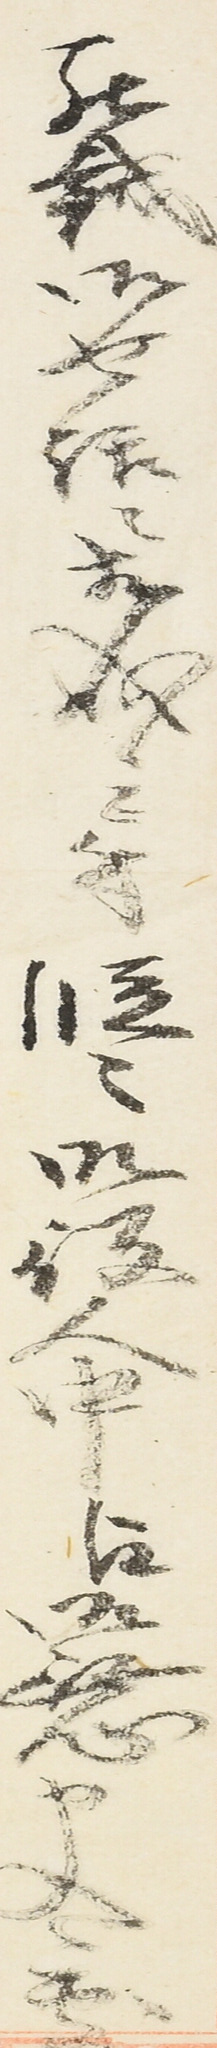罷越御世話ニ相成候ニ付段々御役人中江御無心申入候処

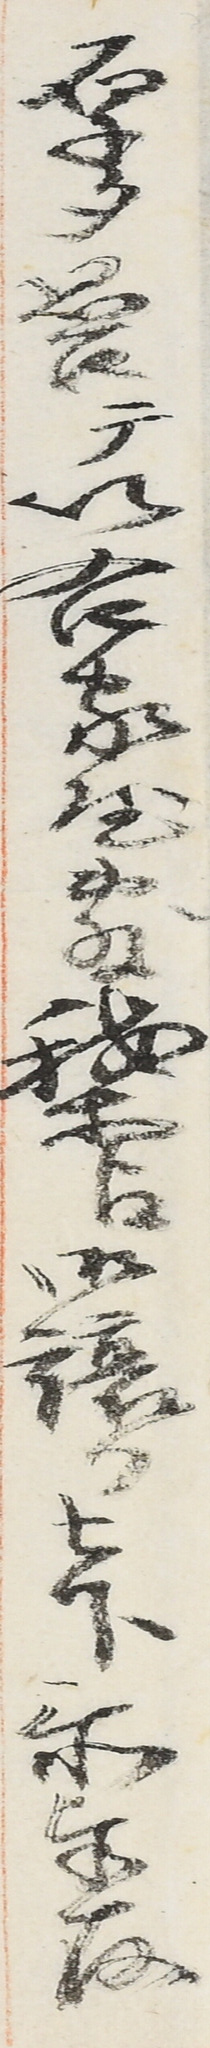厚ク思召ヲ以右家屋敷我等江御譲り被下忝奉存
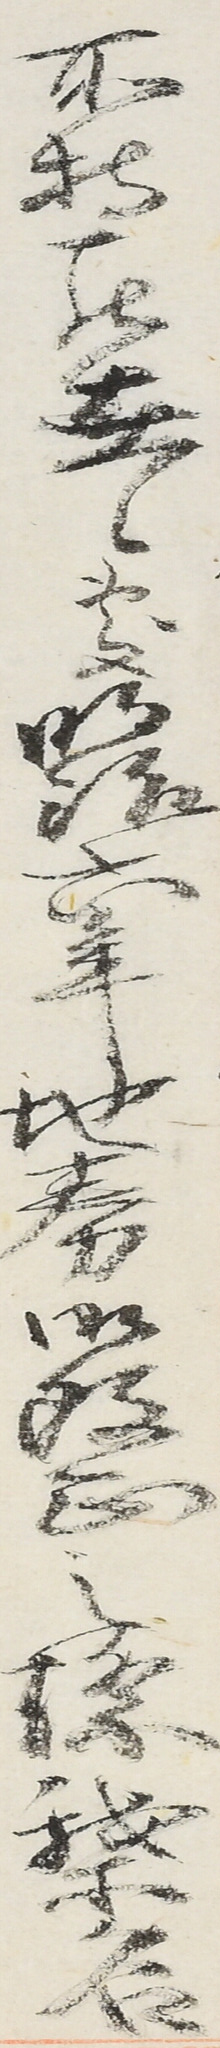所持罷在候処明治六年地券御改正之際我等名
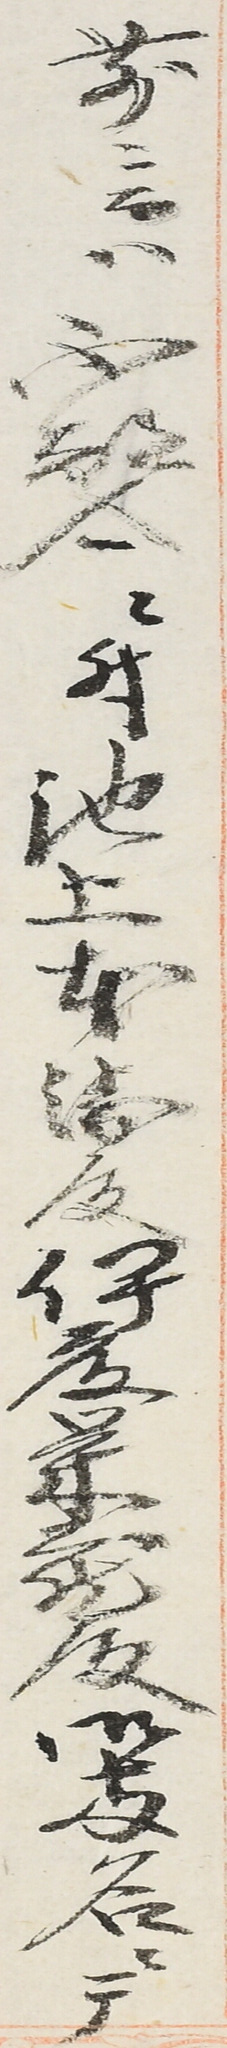前ニ而ハ不都合ニ付池上本衛殿伊藤栄蔵殿御両名ニテ
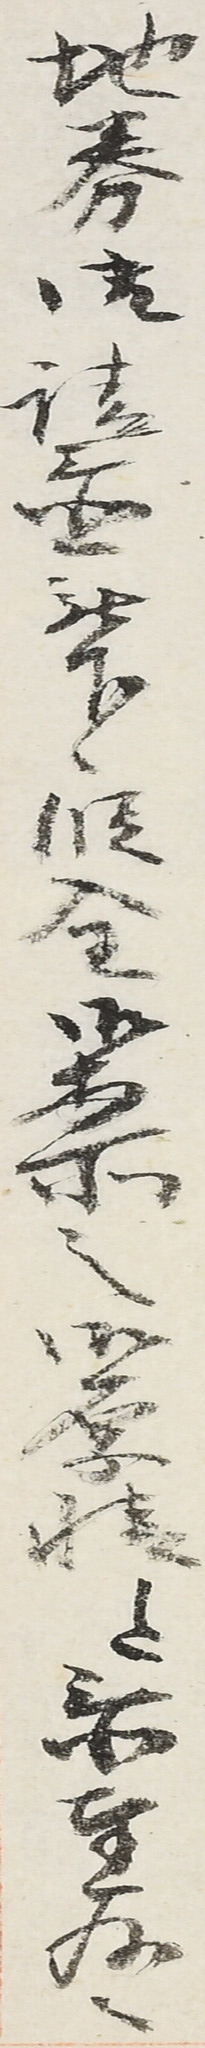地券御請置被下候段全御両所之御厚情と忝奉存候
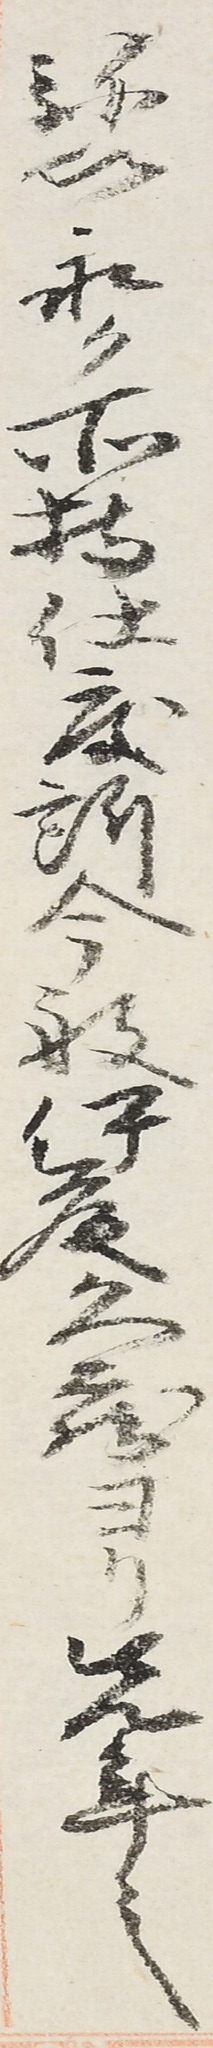弥以永ク所持仕度所今般伊藤久蔵ヨリ先年之
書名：差出申一札之事
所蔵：伊那市立高遠町図書館・合同会社AMANE
